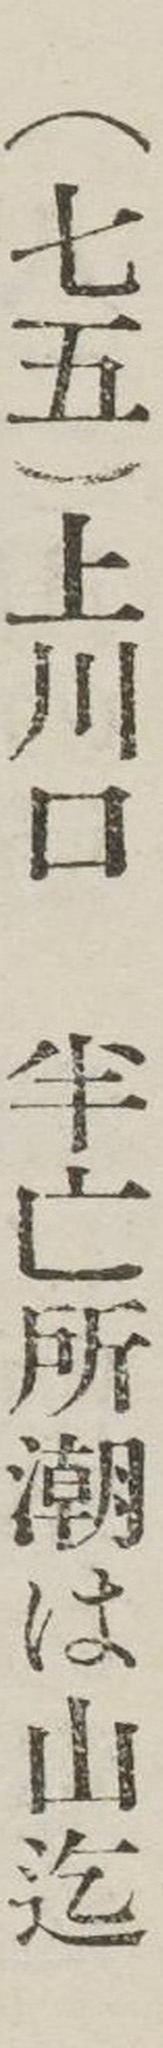上川口半亡所潮は山迄
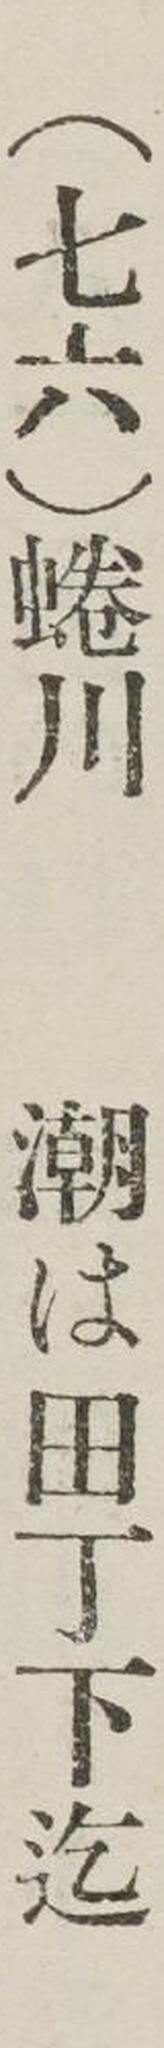蜷川潮は田丁下迄
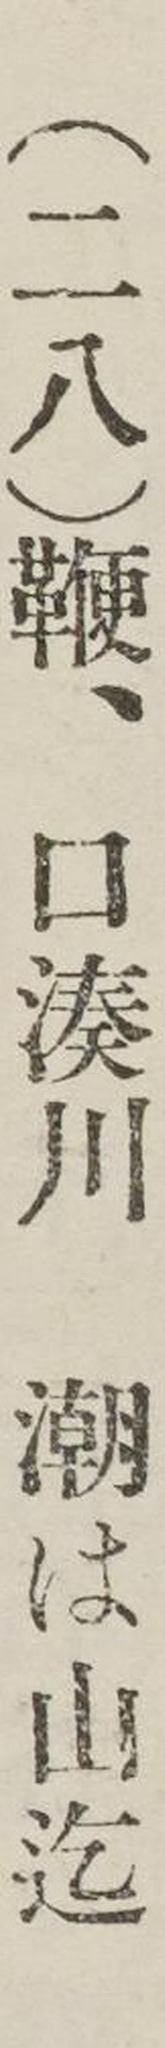鞭、口湊川潮は山迄
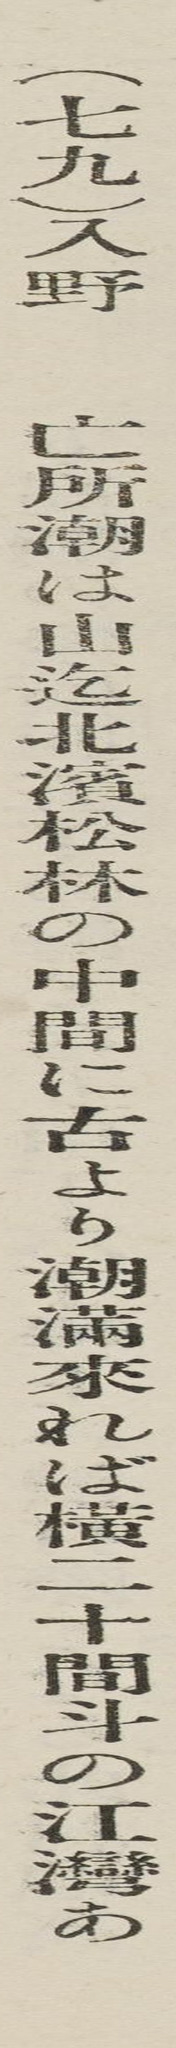入野亡所潮は山迄北浜松林の中間に古より潮満来れば横二十間斗の江湾あ

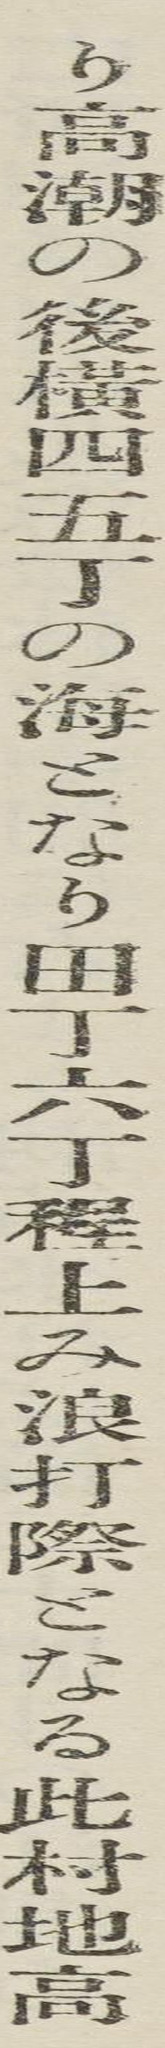り高潮の後横四五丁の海となり田丁六丁程上み浪打際となる此村地高
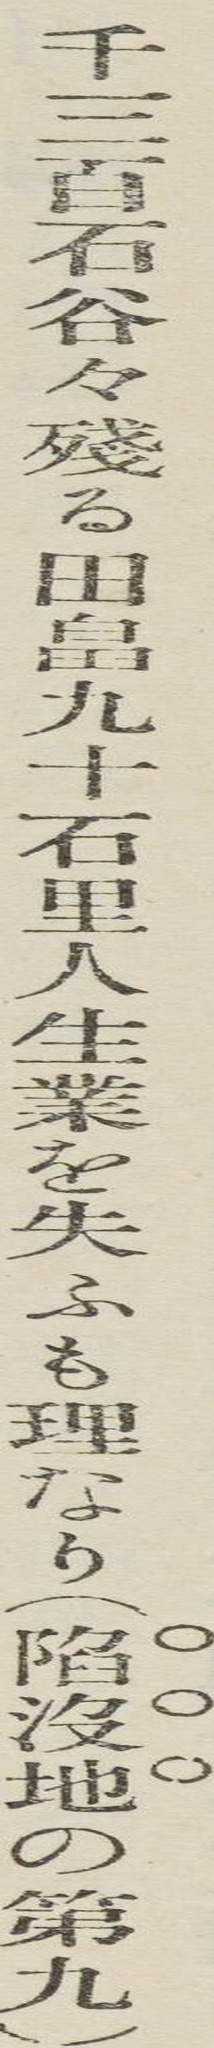千三百石谷々残る田畠九十石里人生業を失ふも理なりの第九）
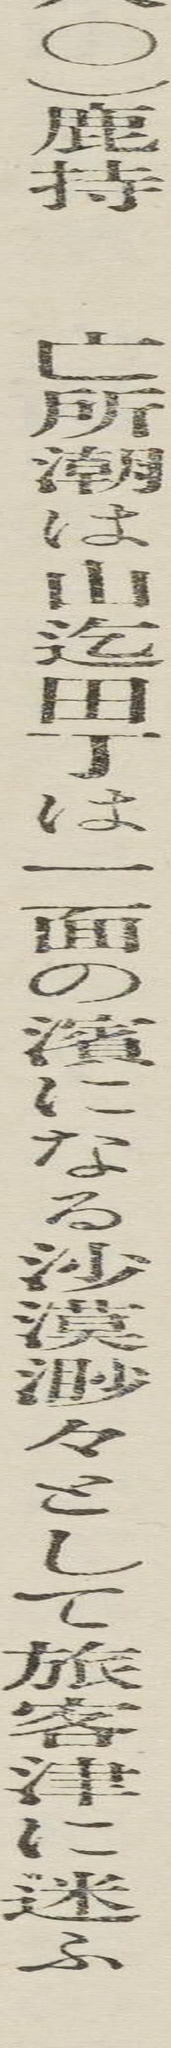鹿持亡所潮は山迄田丁は一面の浜になる沙漠渺々として旅客津に迷ふ
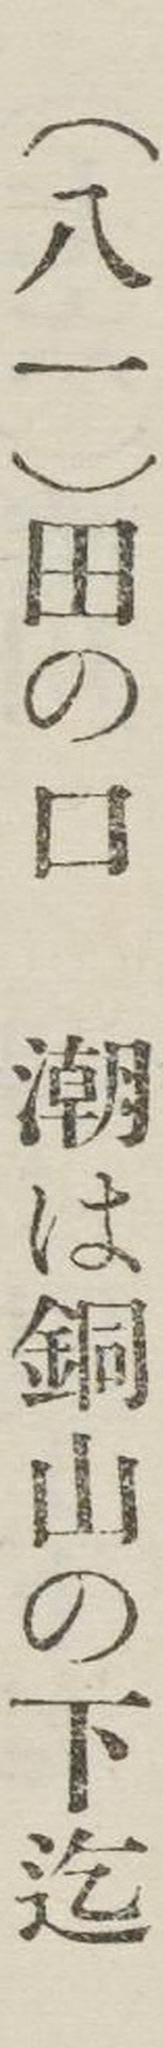田の口潮は銅山の下迄
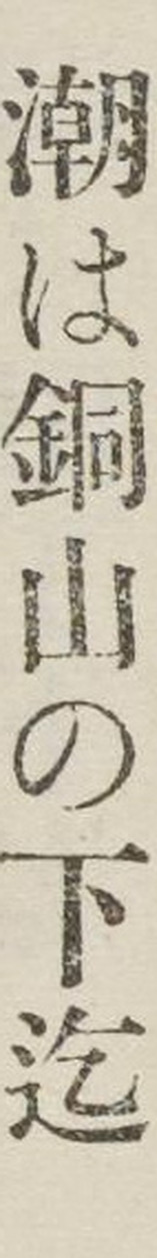田の口潮は銅山の下迄
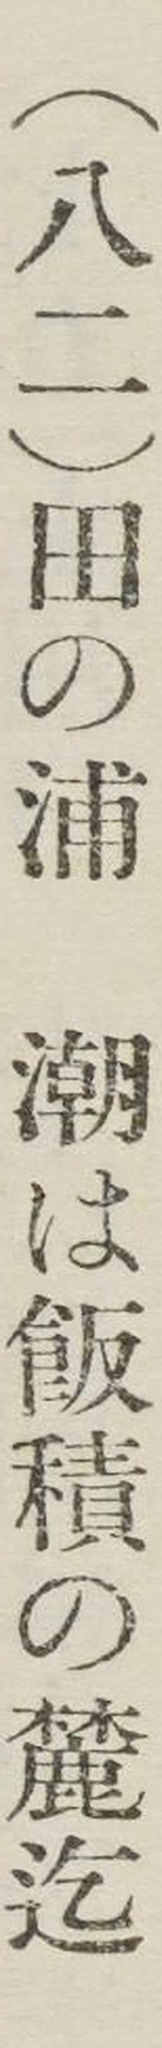田の浦潮は飯積の麓迄
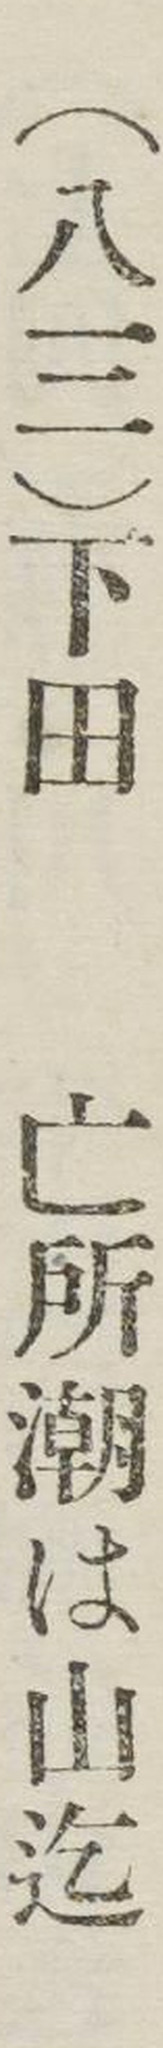下田亡所潮は山迄
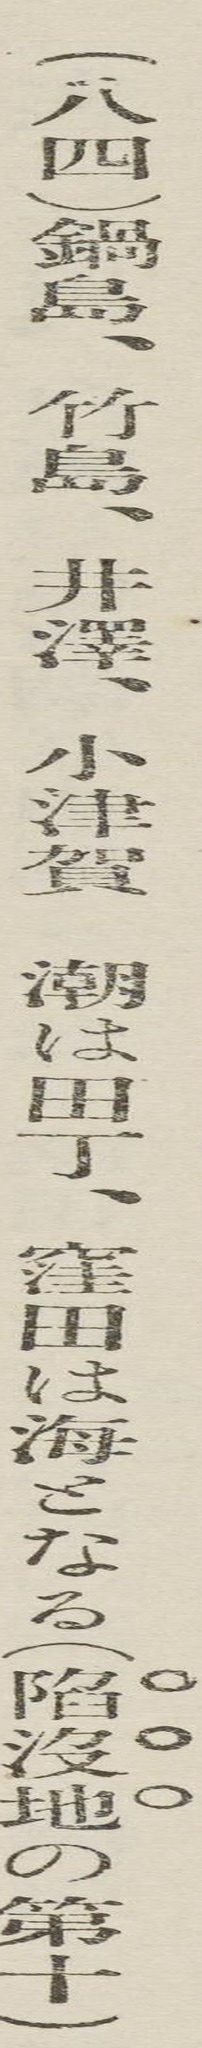鍋島、竹島、井沢、小津賀潮は田丁、窪田は海となるの第十）
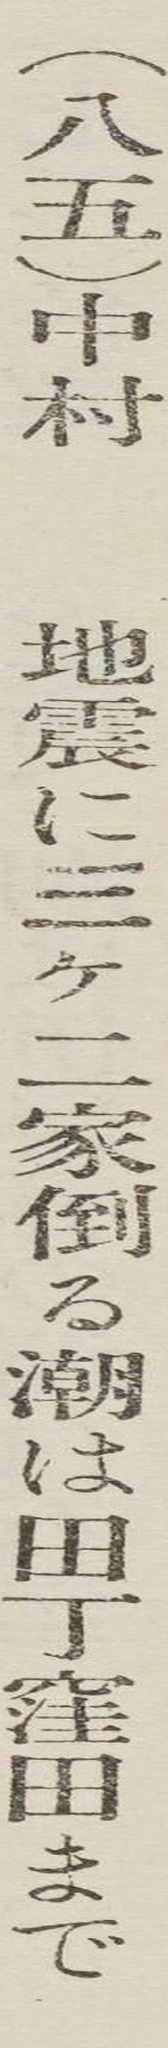中村地震に三ヶ二家倒る潮は田丁窪田まで
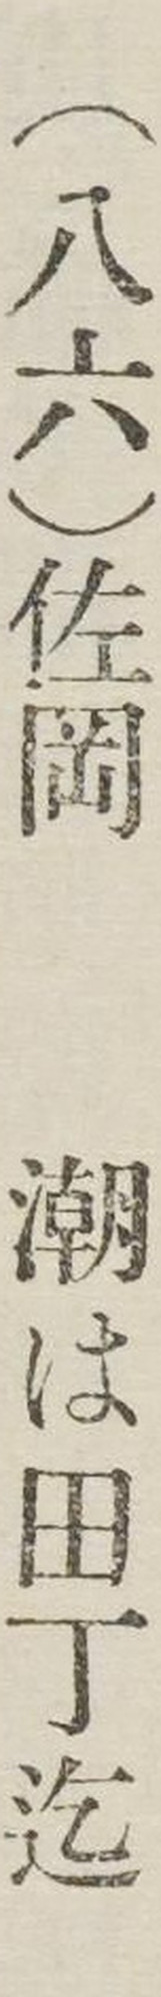佐岡潮は田丁迄
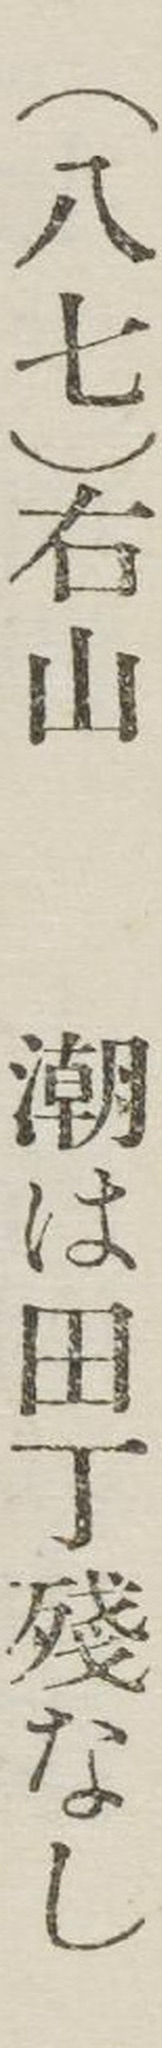右山潮は田丁残なし
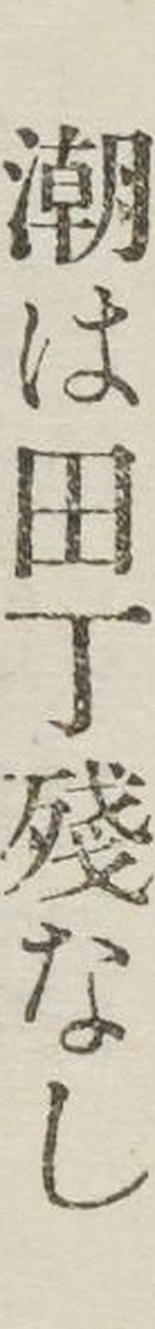右山潮は田丁残なし
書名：土佐古今ノ地震
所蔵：東京大学地震研究所図書室 Earthquake Research Institute Library, The University of Tokyo, JAPAN
